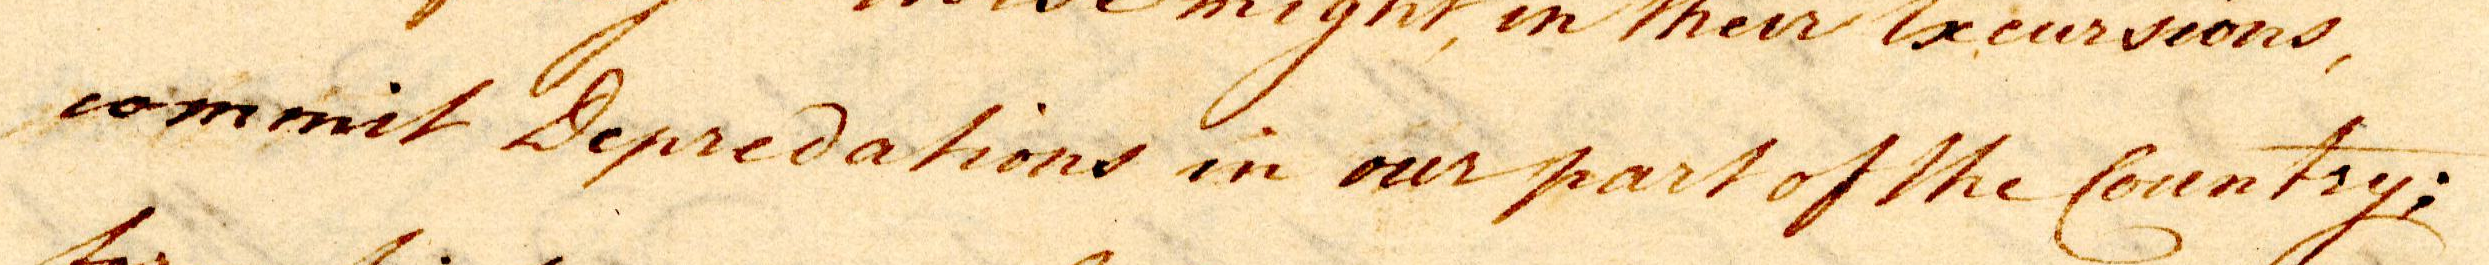commit Depredations in our part of the Country;
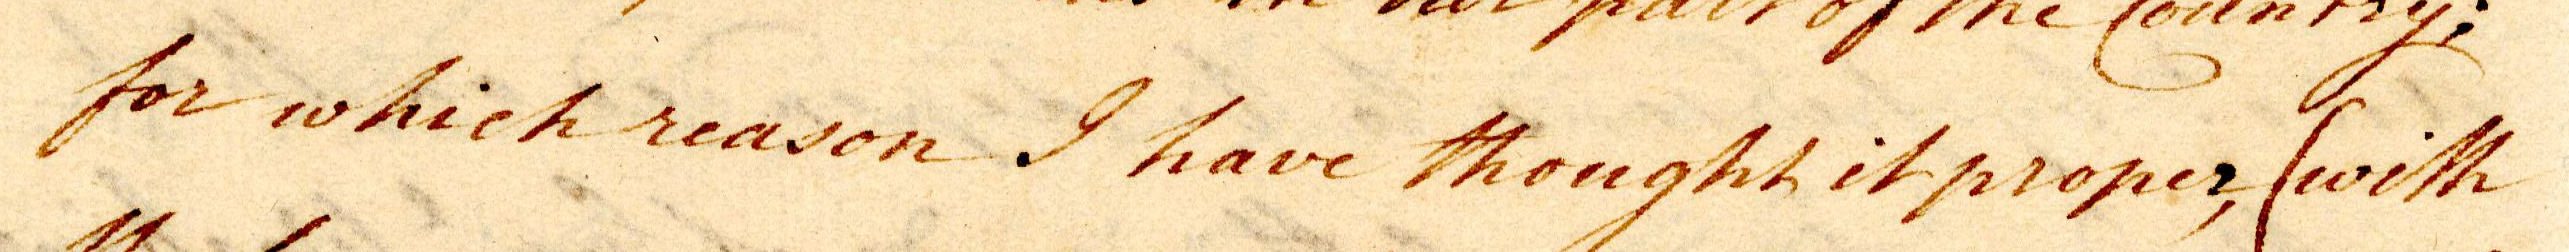for which reason I have thought it proper, (with
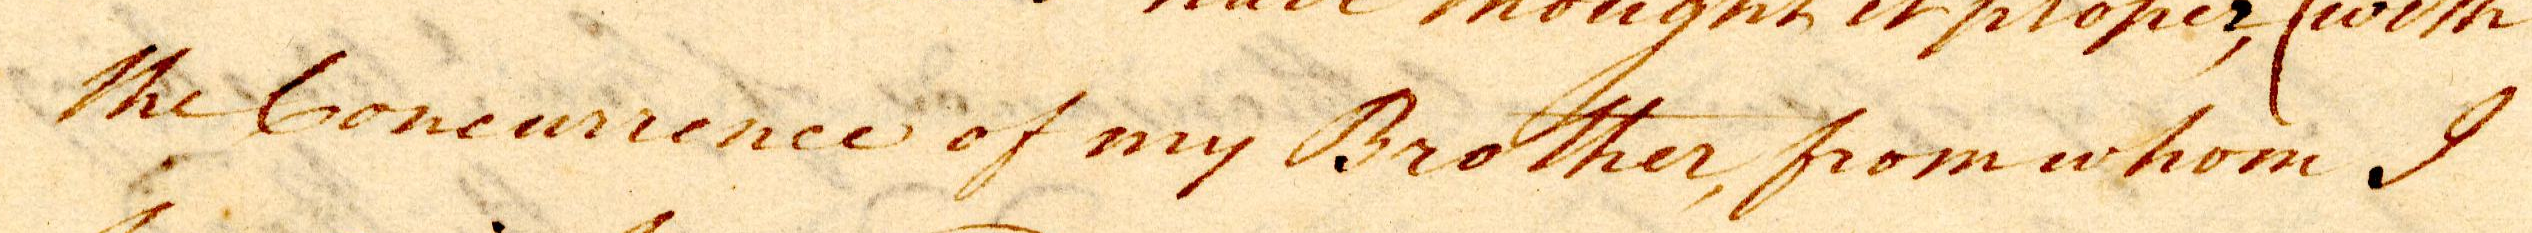the Concurrence of my Brother, from whom I
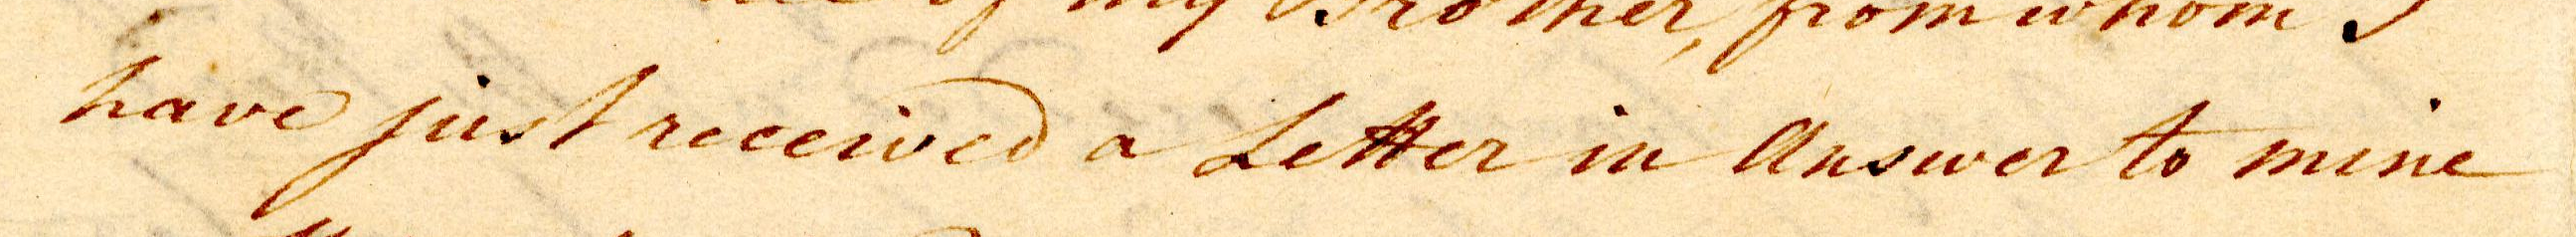have just received a Letter in Answer to mine
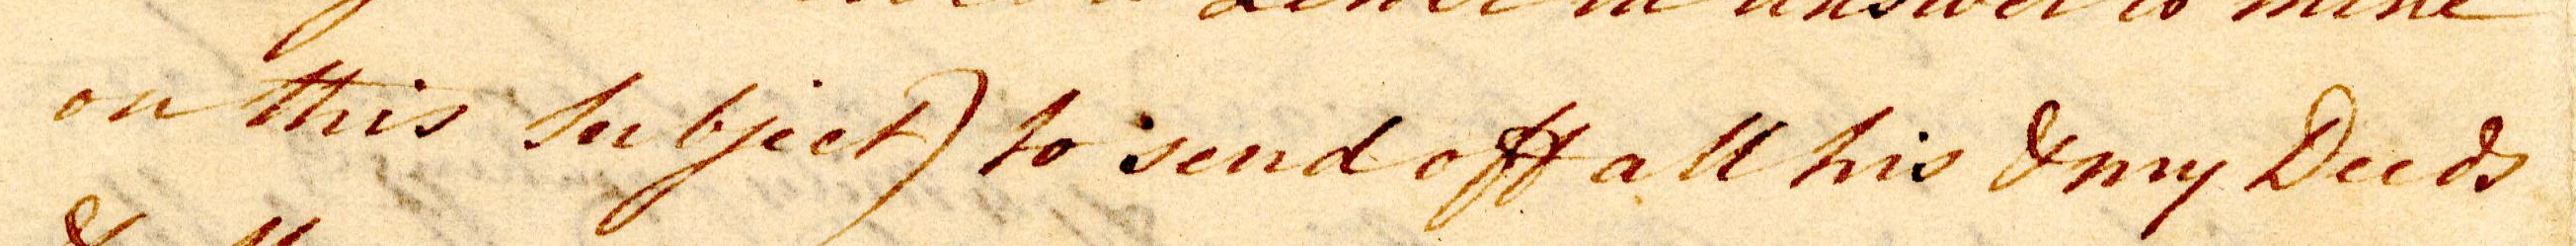on this subject) to send off all his & my Deeds
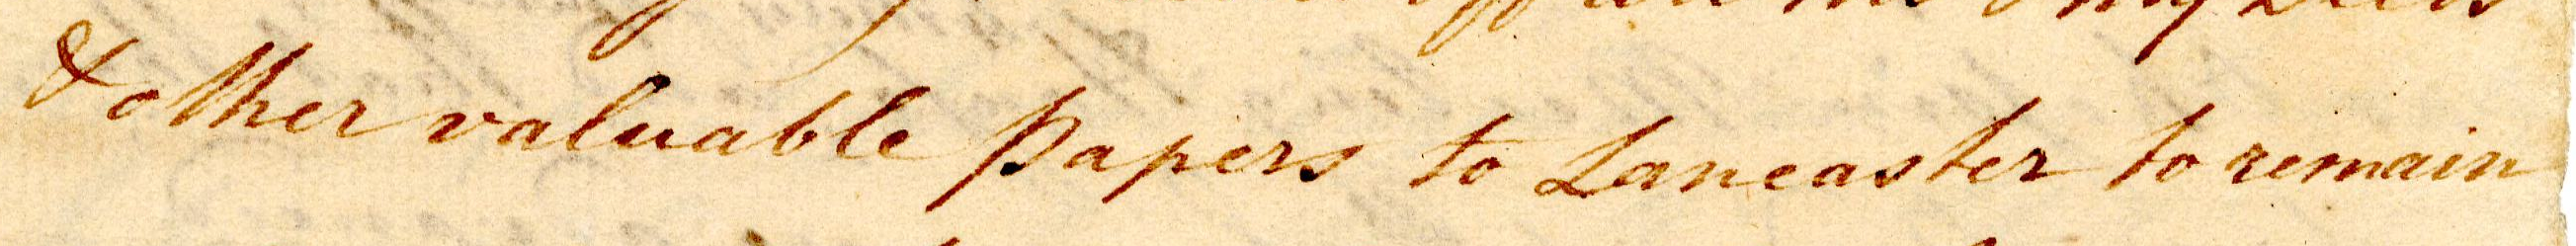& other valuable Papers to Lancaster to remain
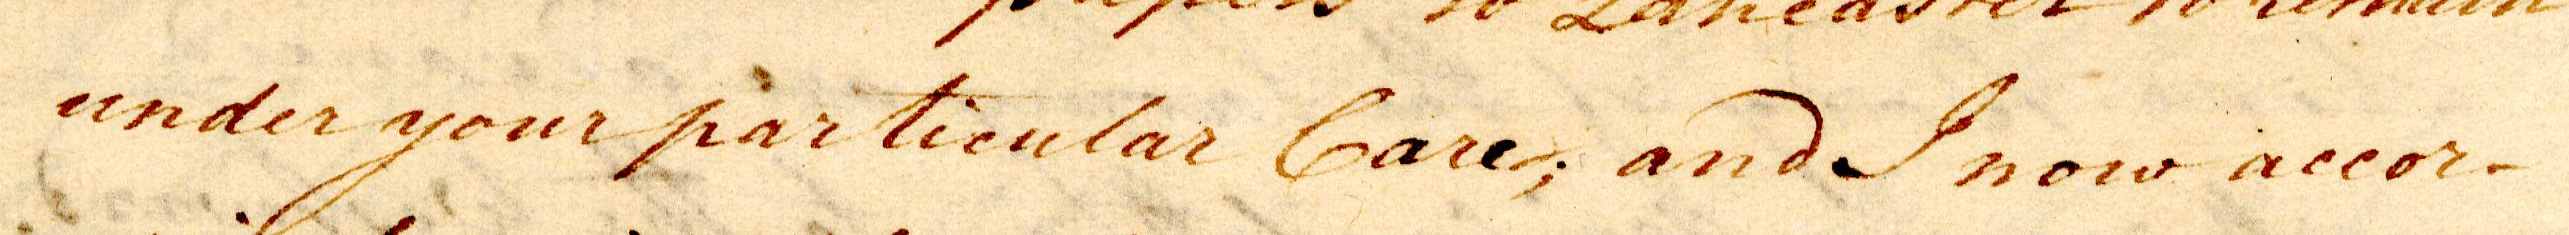under your particular Care; and I now accor-
